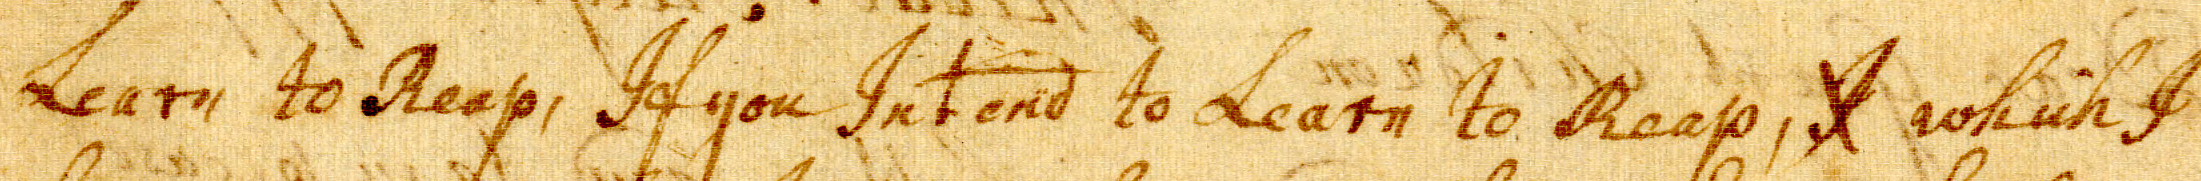Learn to Reap, If you Intend to Learn to Reap, which I
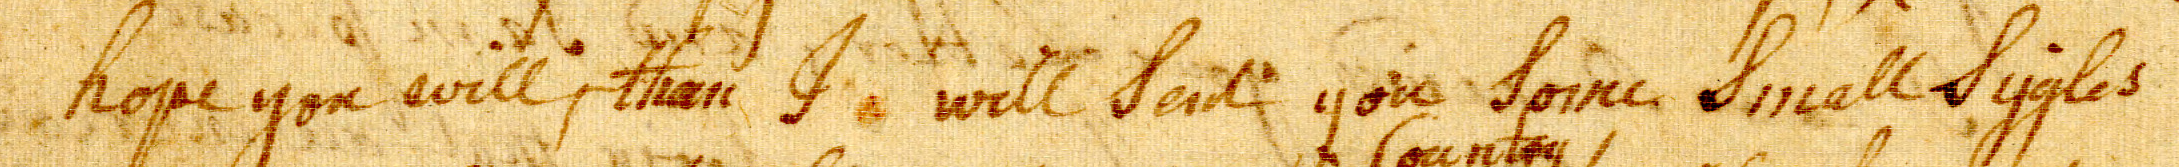hope you will, than I will Send you some Small Sygles
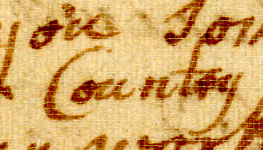Country
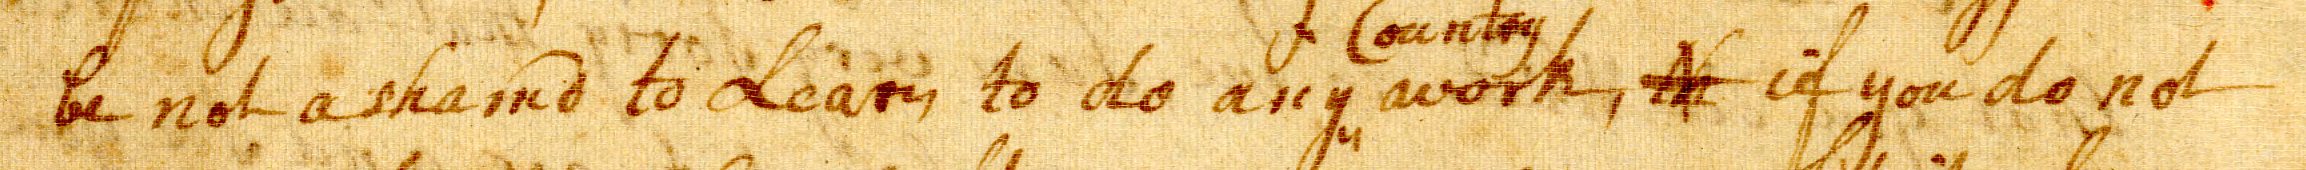be not ashamd to Learn to do any work, if you do not
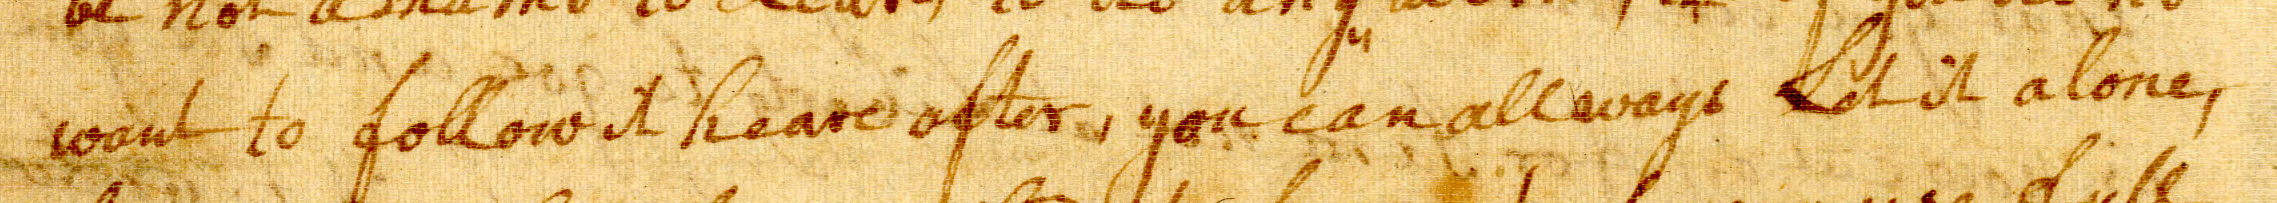want to follow it hear after, you can allways Let it alone,
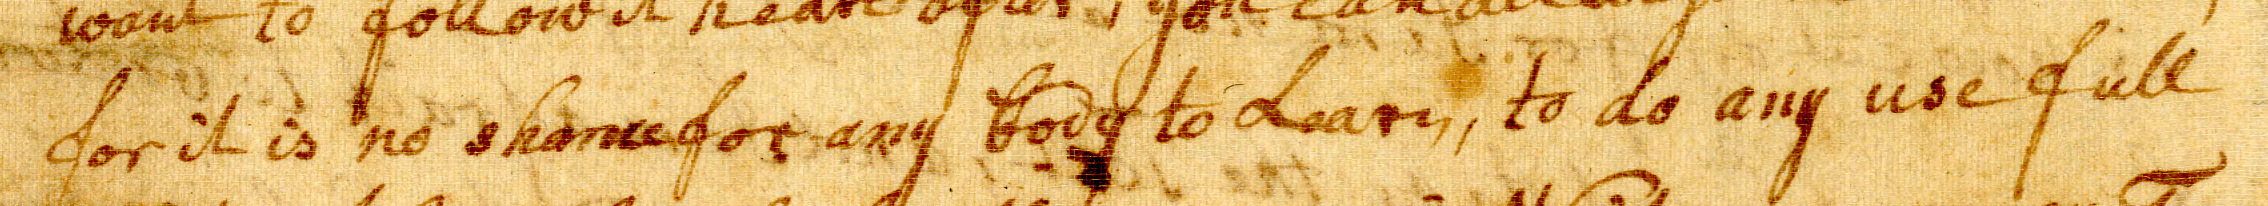for it is no shame for any body to Learn, to do any usefull
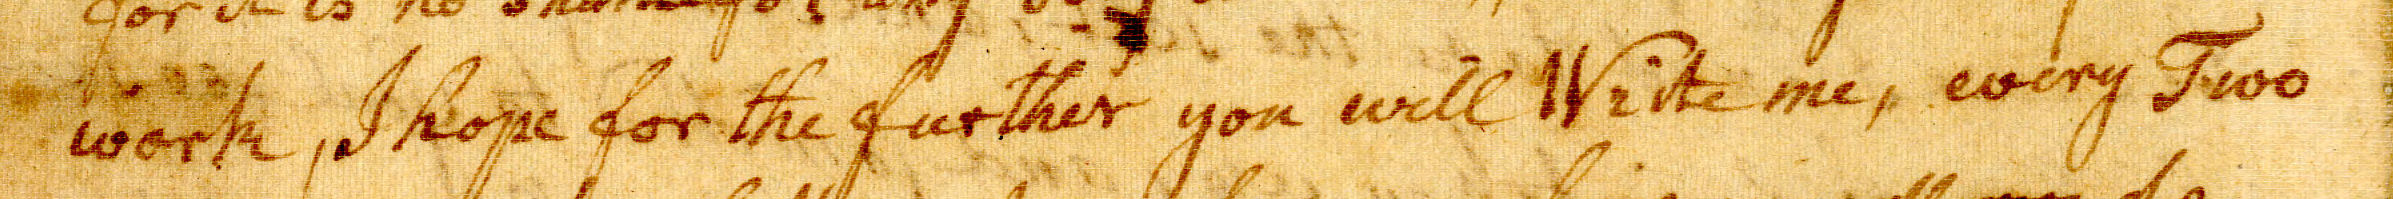work, I hope for the further you will Write me, every Two
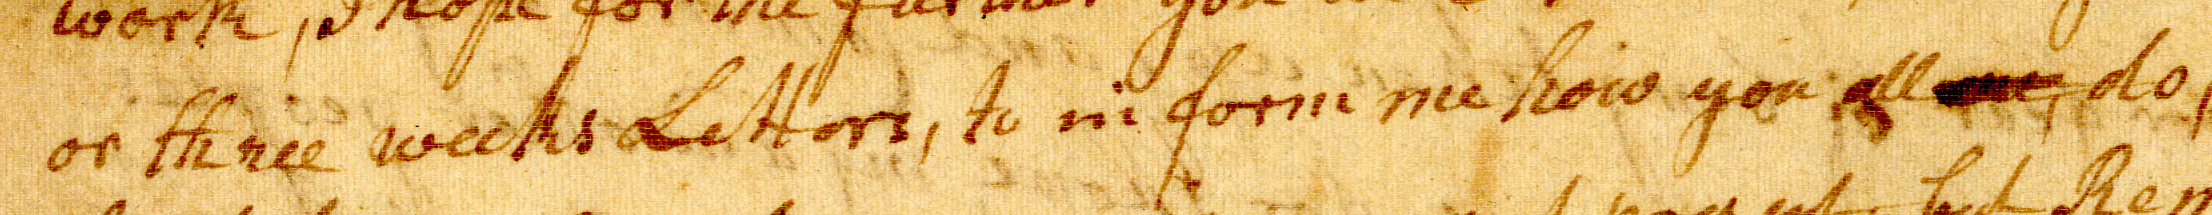or three weeks letters, to inform me how you all [are] do,
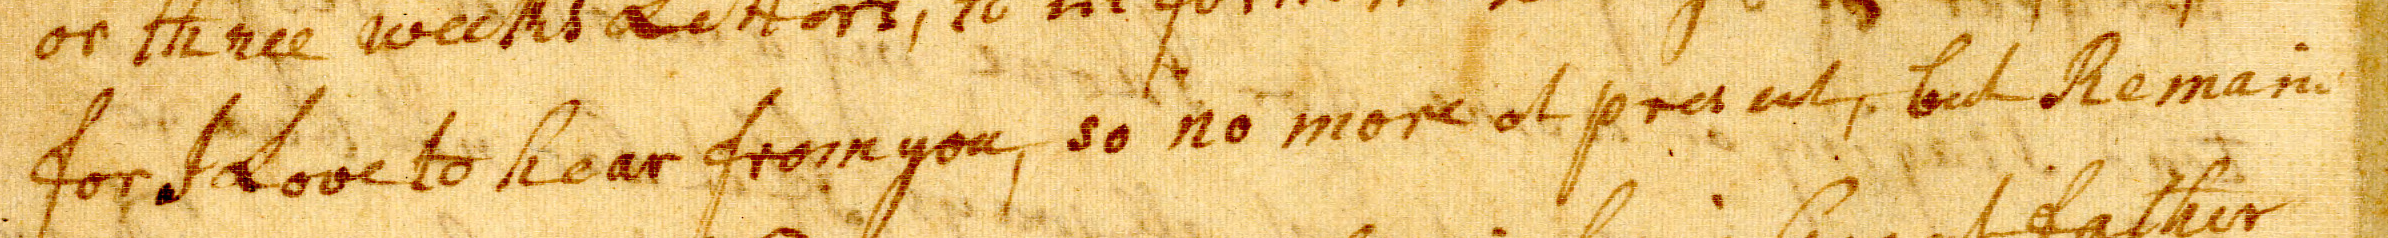for I Love to hear from you, so no more at present but Remain
